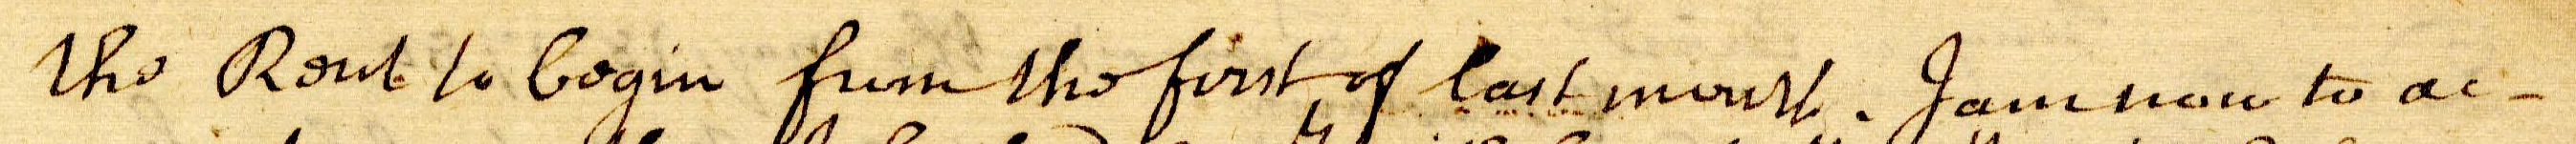the Rent to begin from the first of last month. I am now to ac-
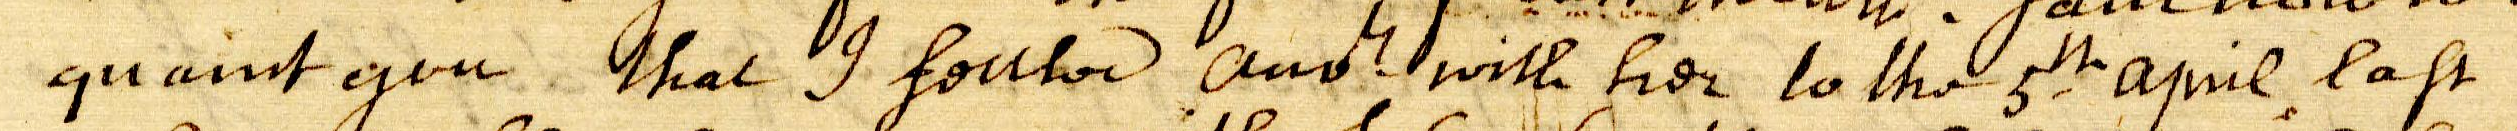quaint you that I {settled} Acco^t. with her to the 5^t April last
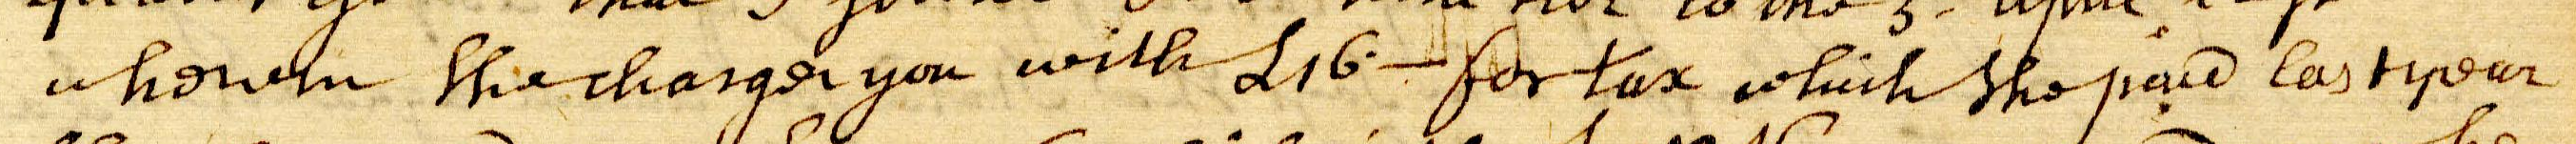{whenever} she charges you with £16- for tax which she paid last year
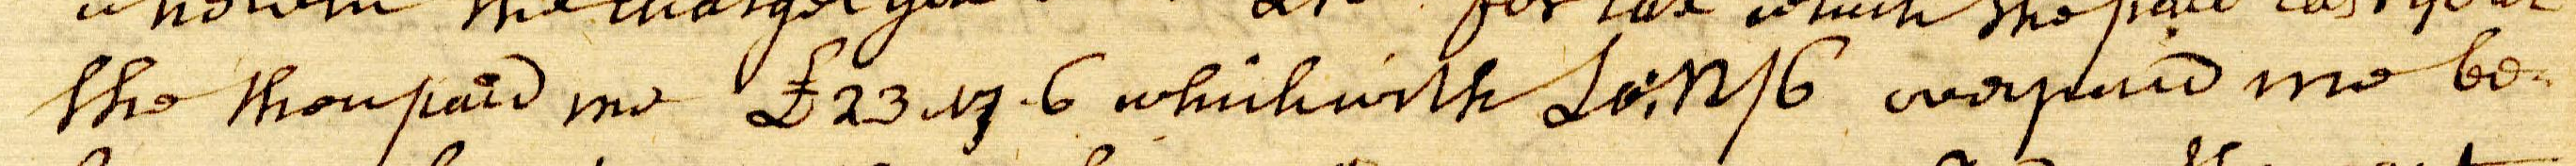the then paid me £23.17.6 which with Lo: 12s6 overpaid me be-
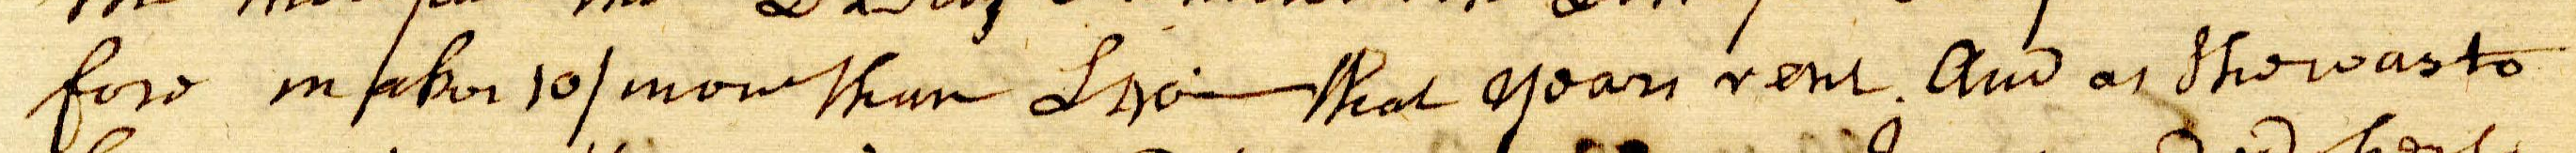ford makes 10s more than £10- that years rent. And as she was to
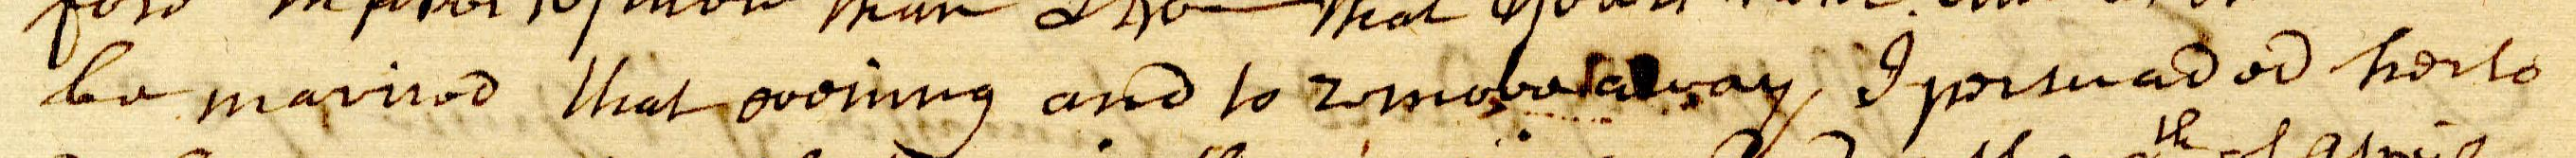be married that evening and to to move away I persuaded her to
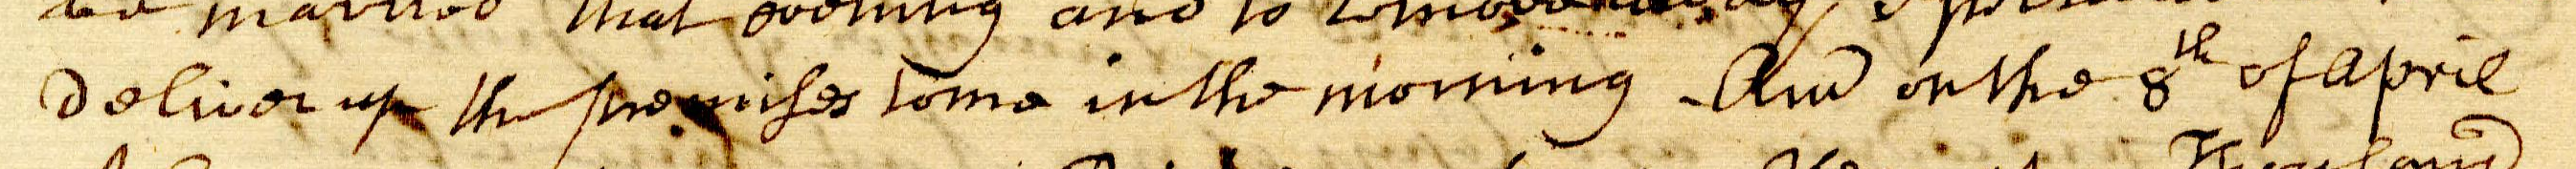deliver up the premises to me in the morning- And on the 8^th of April
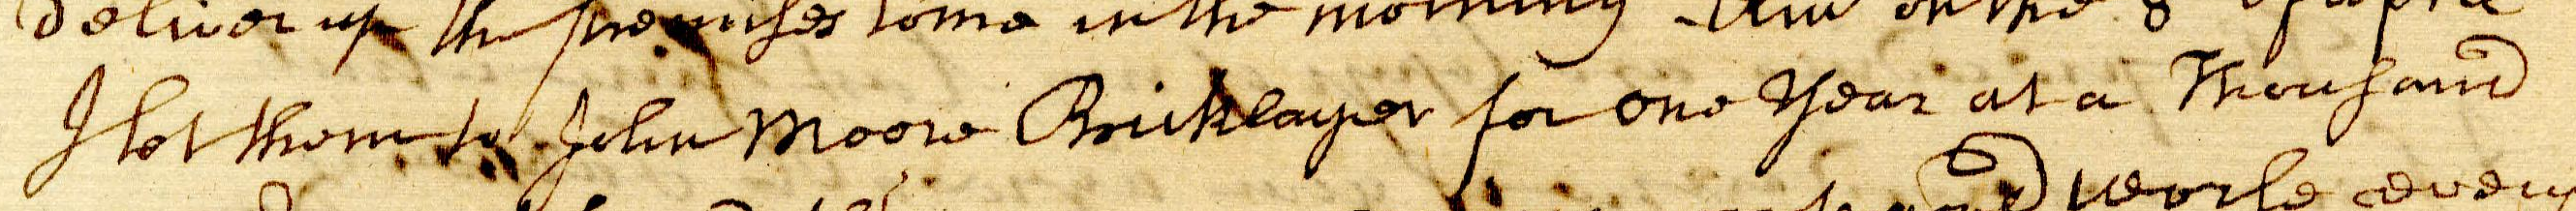I let them to John Moore Bricklayer for one Year at a Thousand
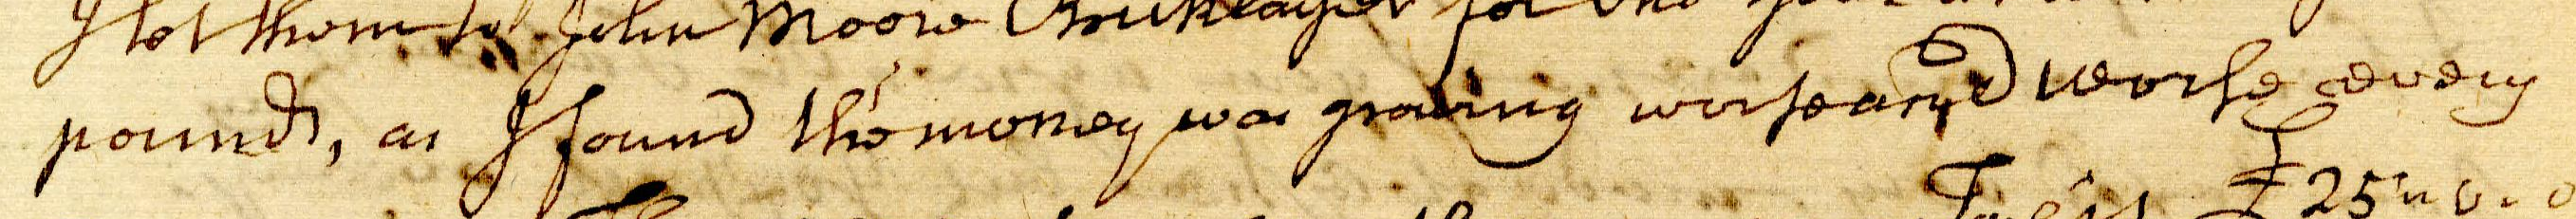pounds, as I found the money was growing worse and worse every
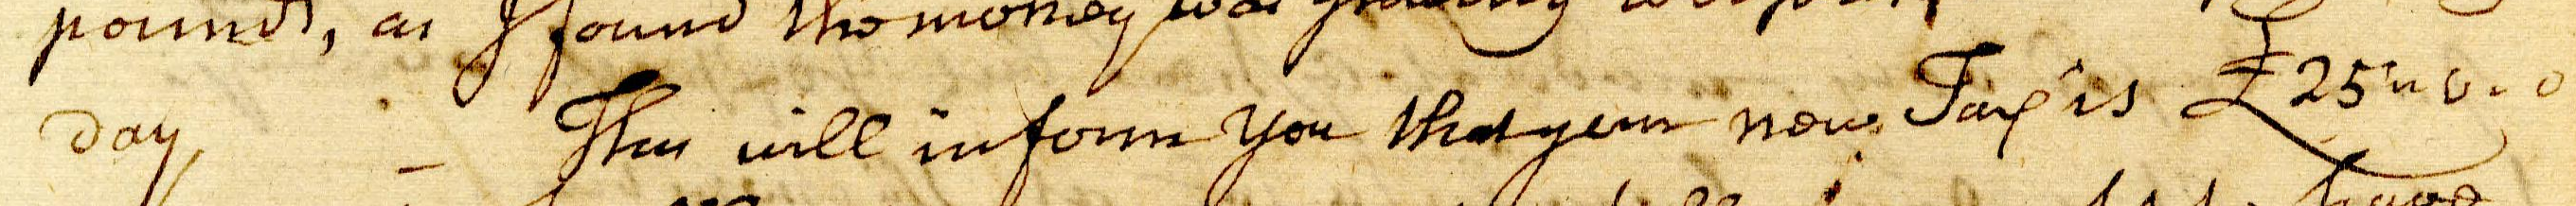day This will inform you that year now Tax is £25..0.0
